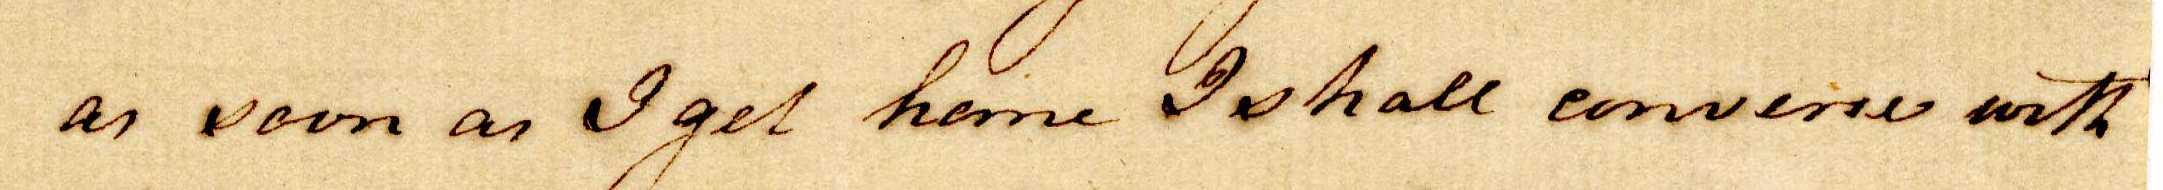as soon as I get home I shall converse with
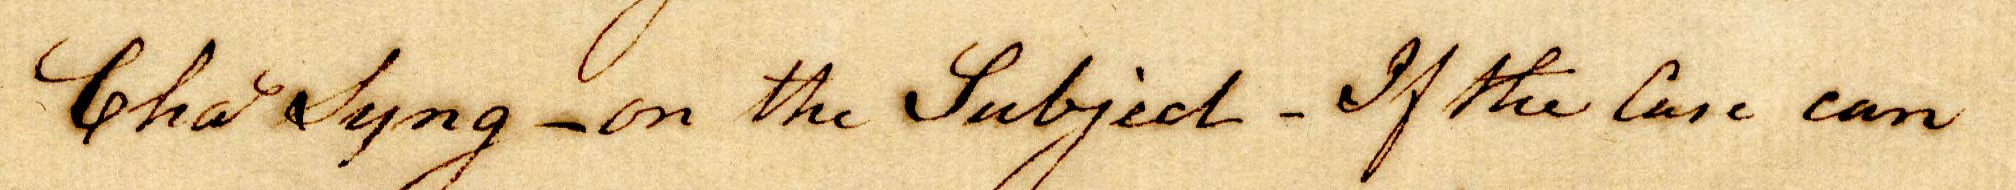Cha^s Syng, on the Subject. If the Case can
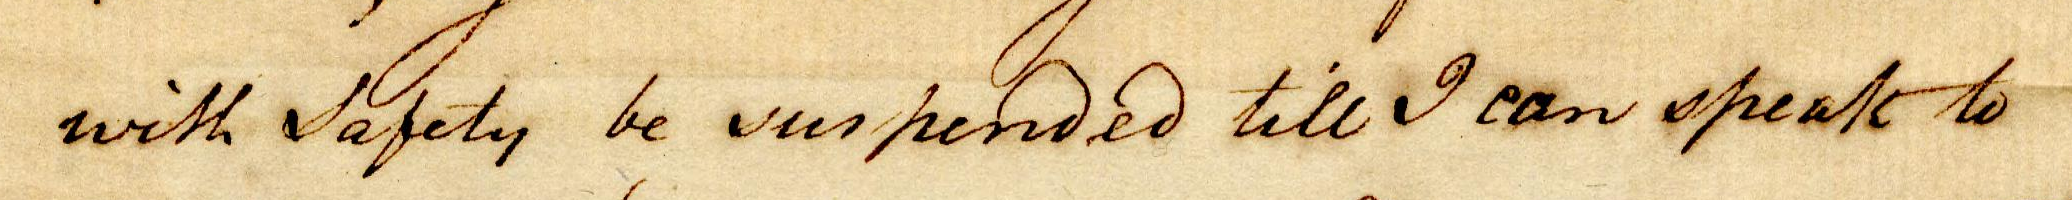with Safety be suspended till I can speak to
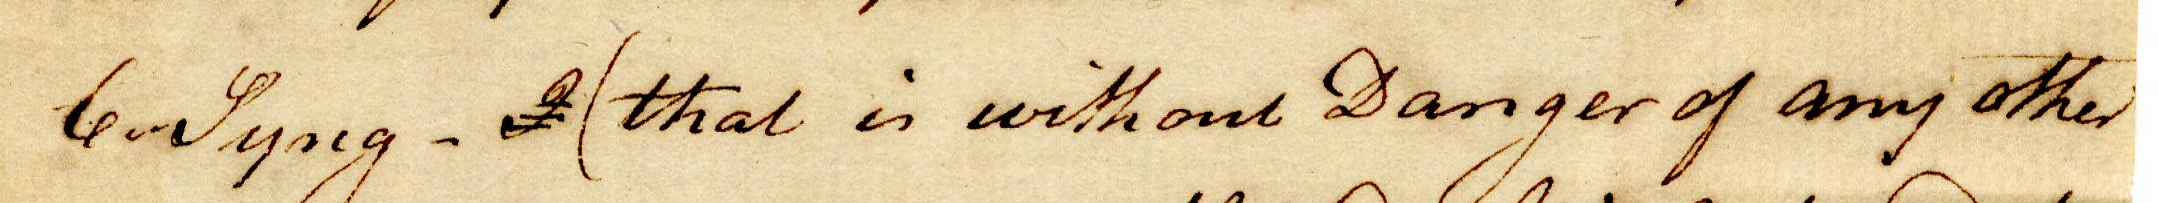C. Syng, I (that is without Danger of any other
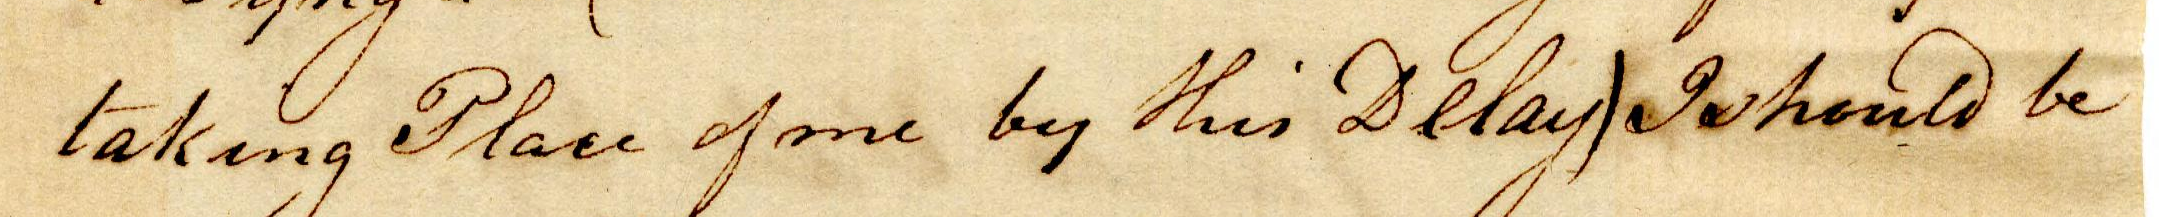taking Place of me by this Delay) I should be
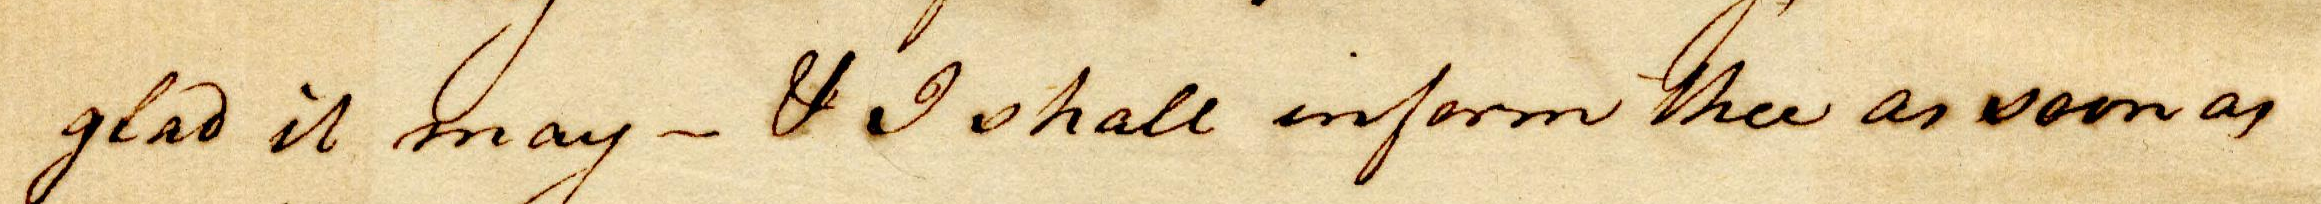glad it may, & I shall inform thee as soon as
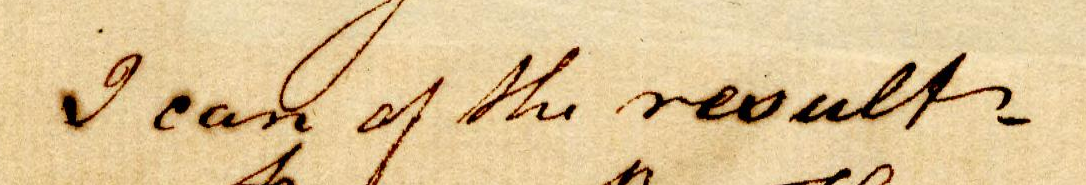I can of the result.
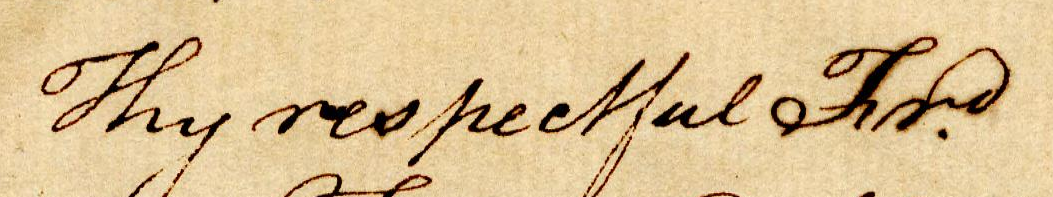Thy respectful Fr^d.
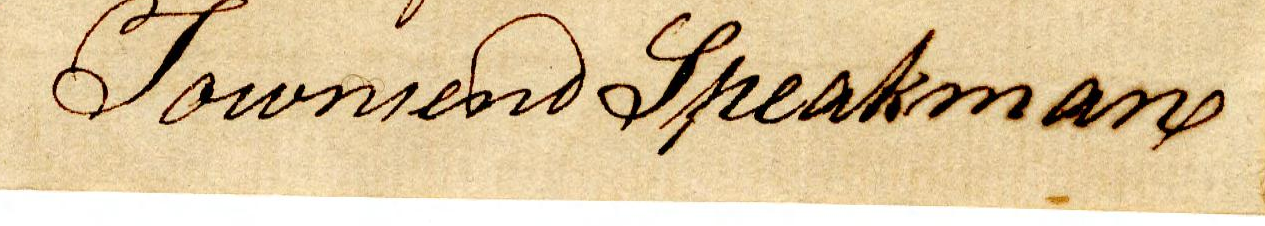Townsend Speakman
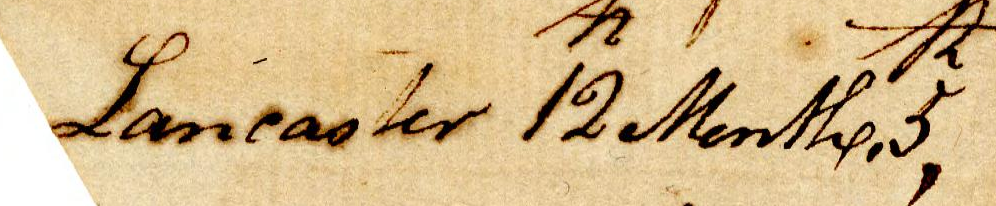Lancaster 12 Month, 5^th,
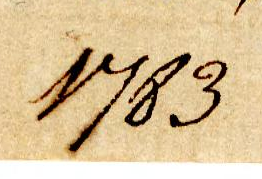1783
